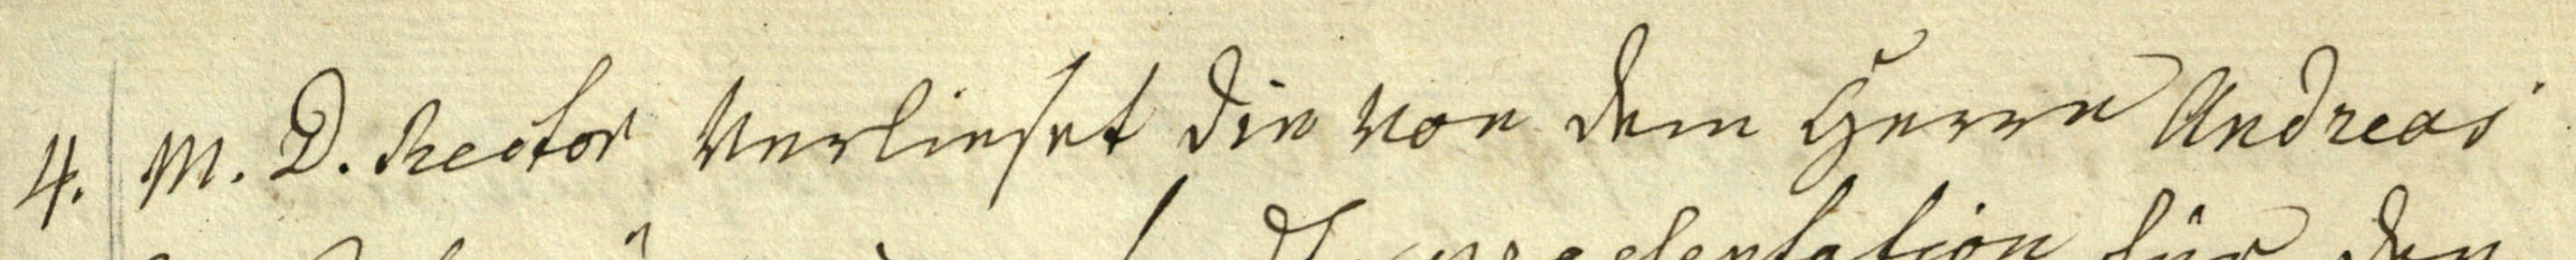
4. M. D. Rector verlieset die von dem Herrn Andreas
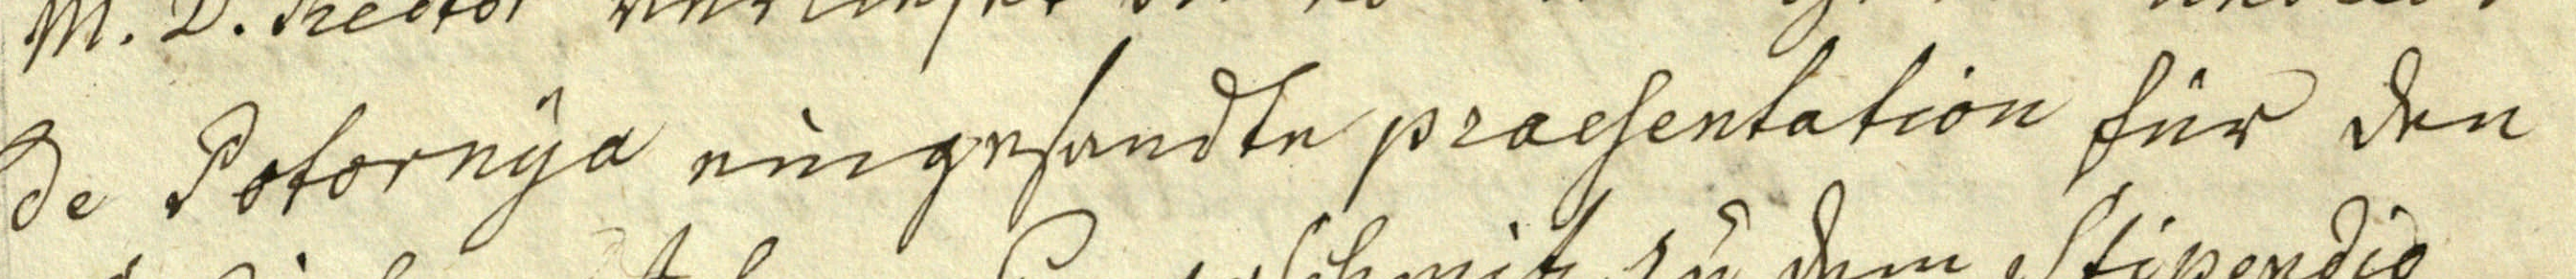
e Potornÿa eingesandte praesentation für den
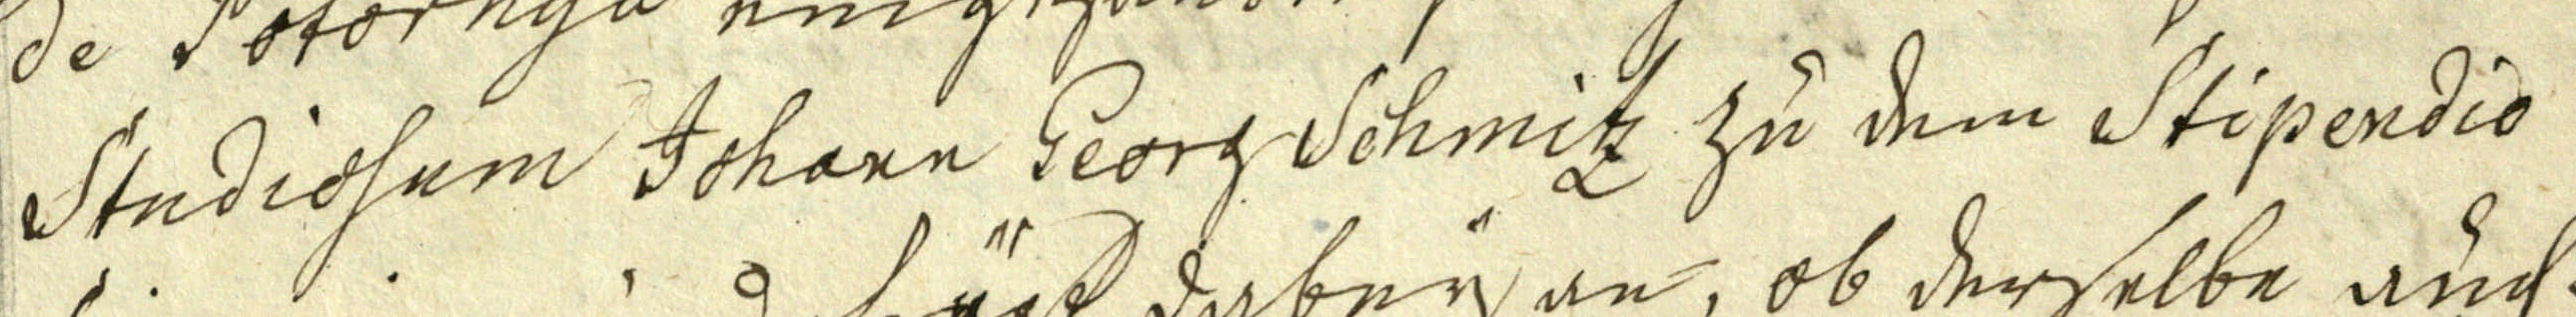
Studiosum Johann Georg Schmitz zu dem Stipendio
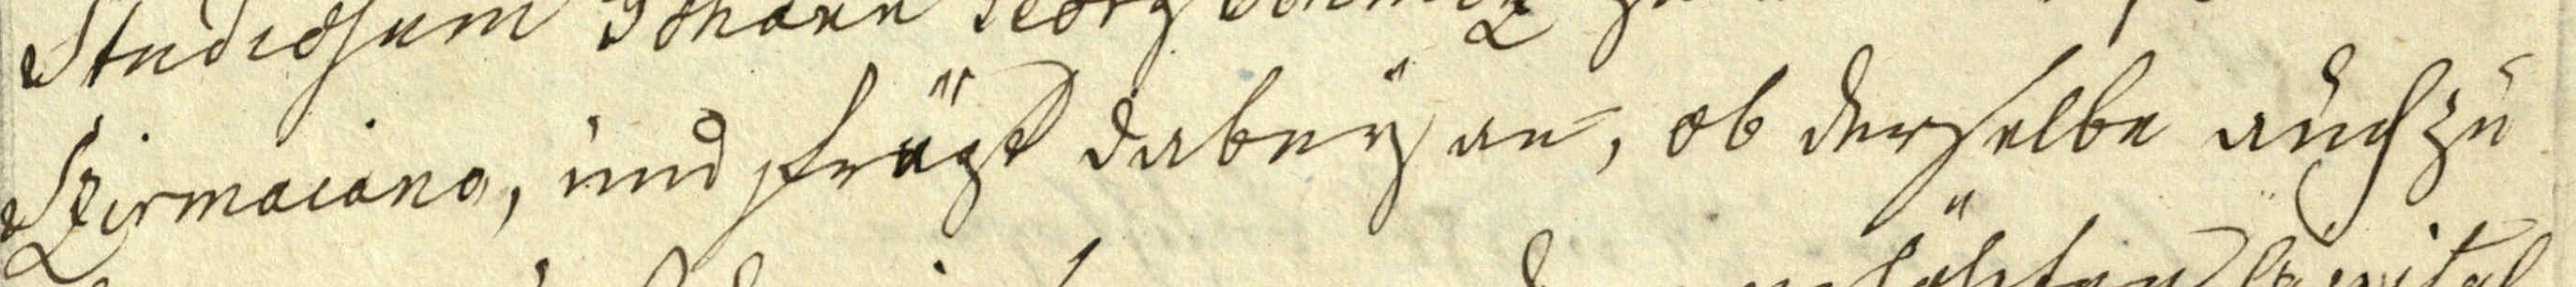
Szirmaiano, und frägt dabeÿ an, ob derselbe auch zu
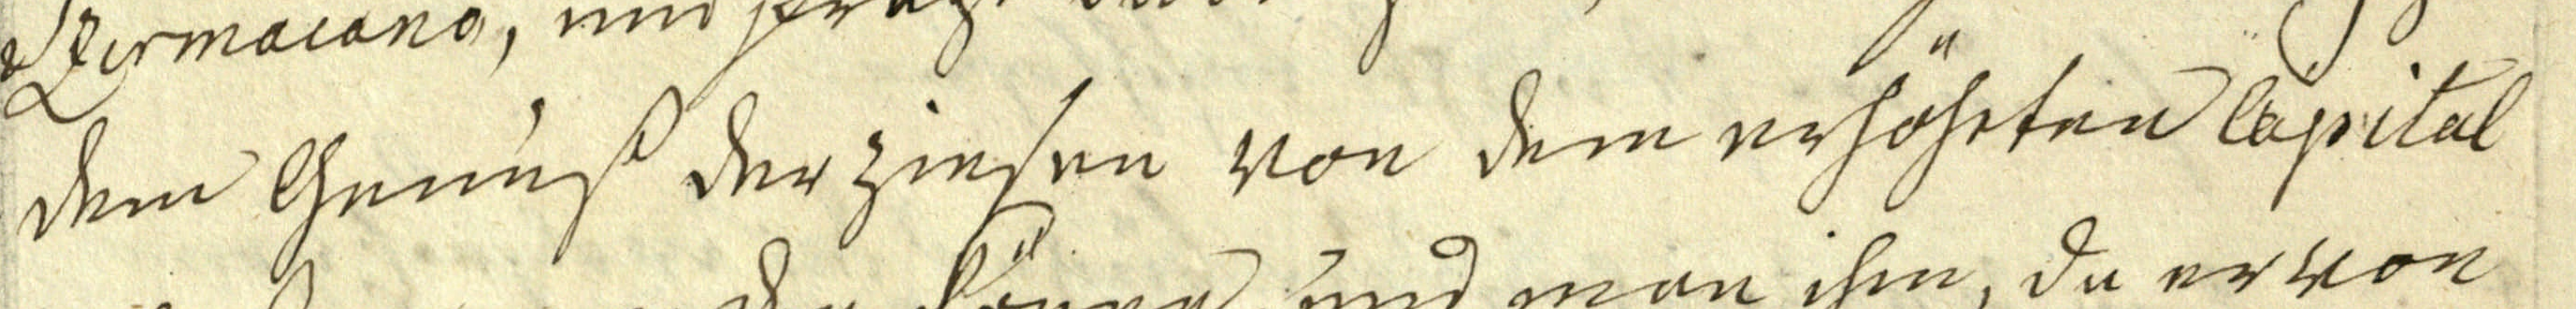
dem Genuß der Zinsen von dem erhöheten Capital
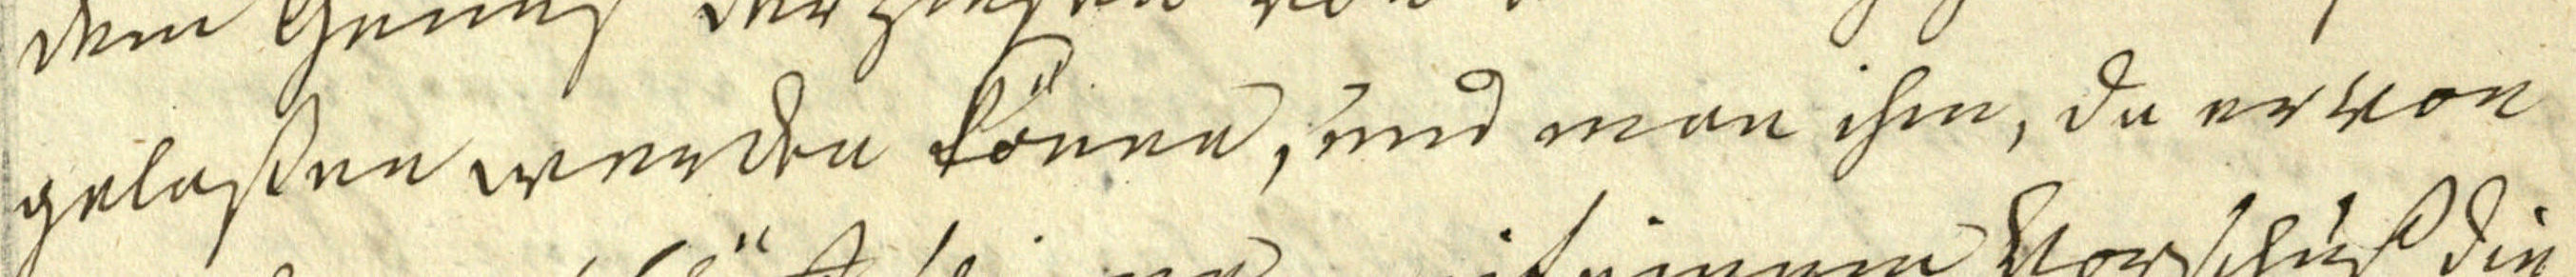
gelaßen werden könne, und man ihm, da er von
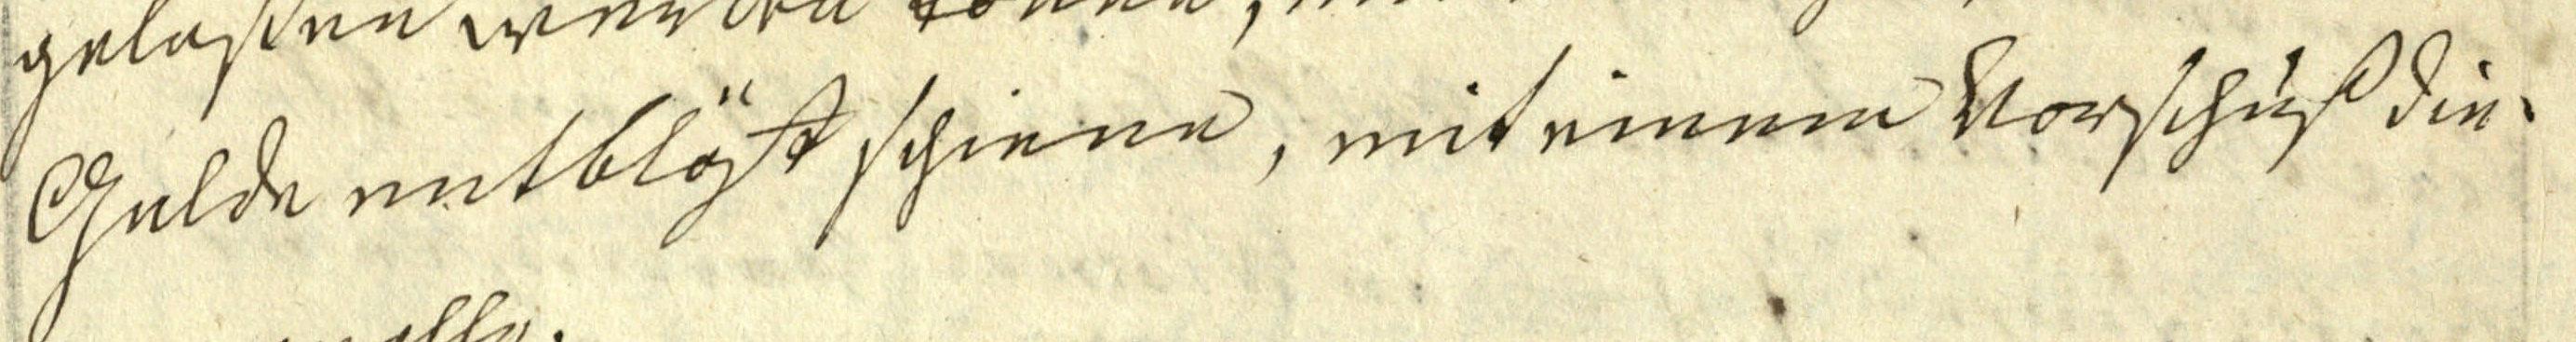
Gelde entblöst schiene, mit einem Vorschuß die¬
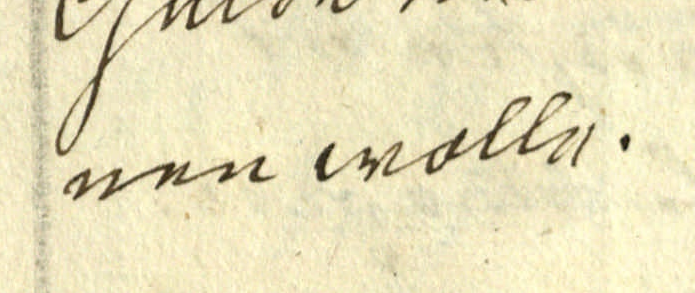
nen wolle.
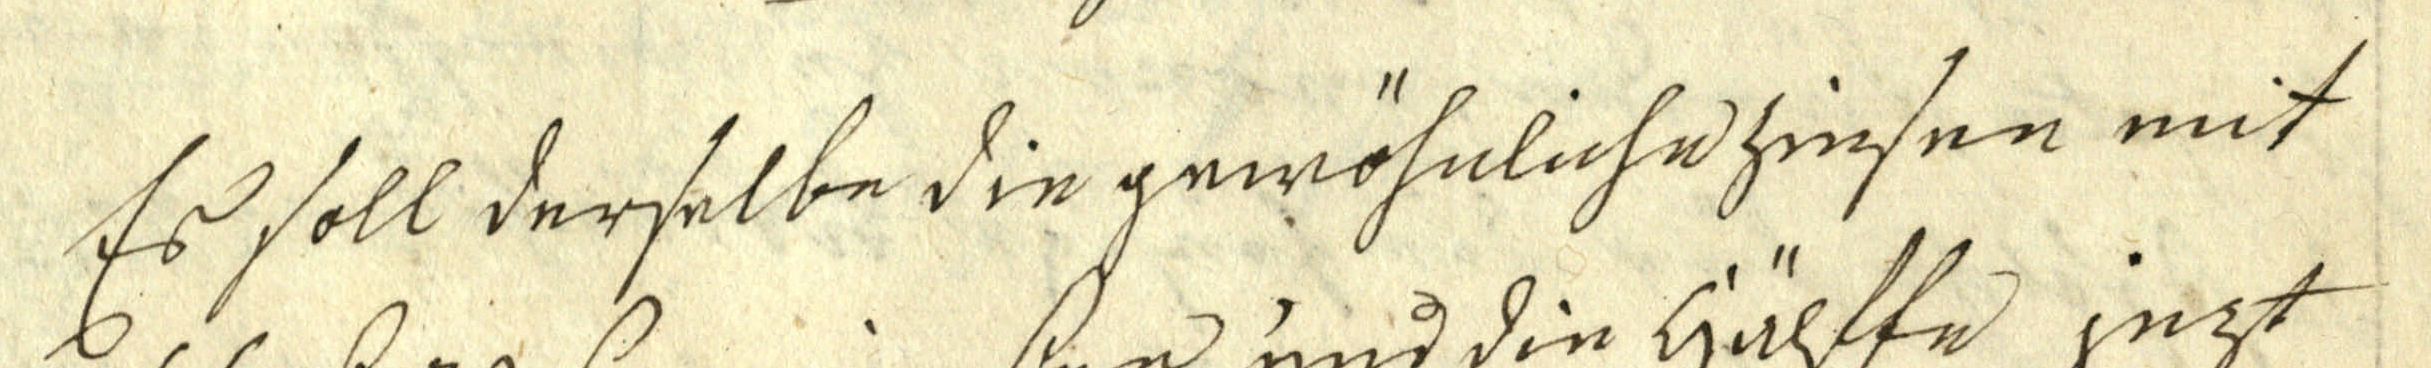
Es soll derselbe die gewöhnliche Zinsen mit
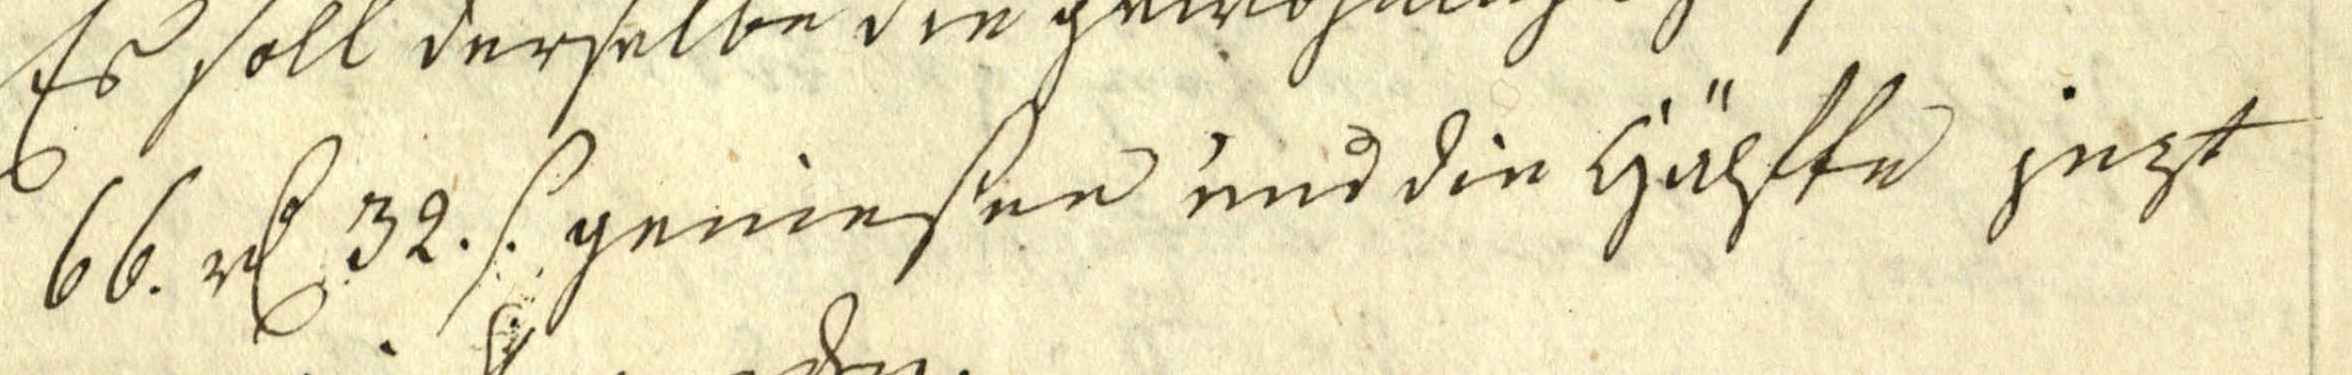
66. rl. 32. s. genießen und die Hälfte jezt
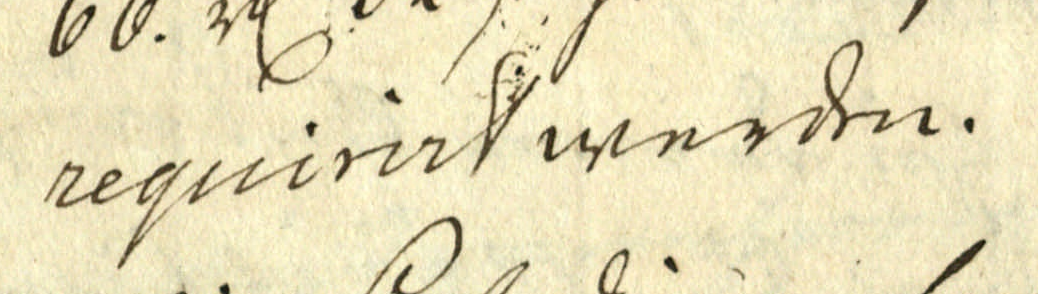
requirirt werden.
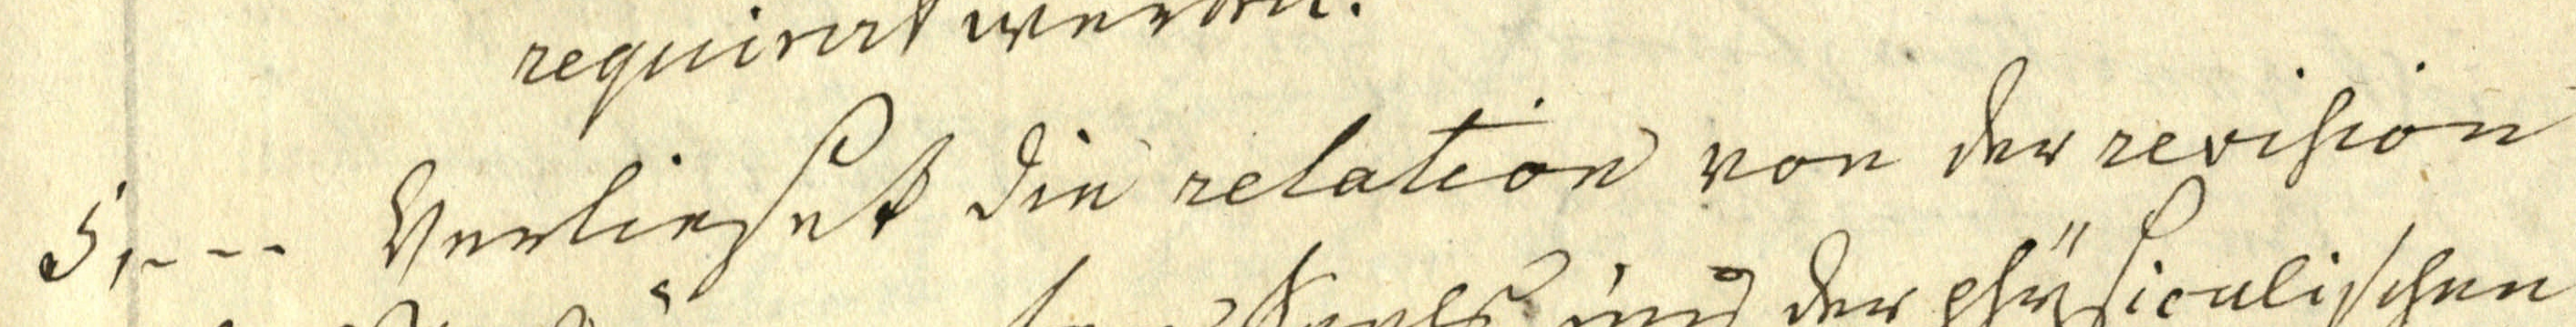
5, Verlieset die relation von der revision
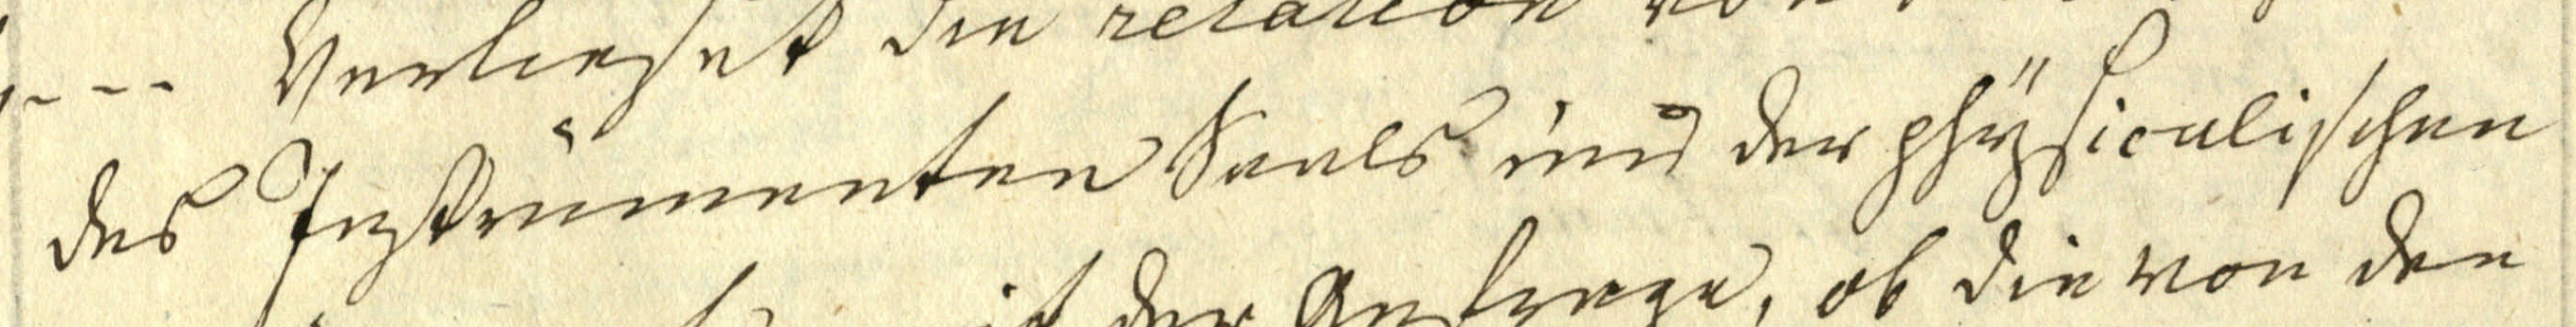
des Instrumenten Saals und der phÿsicalischen
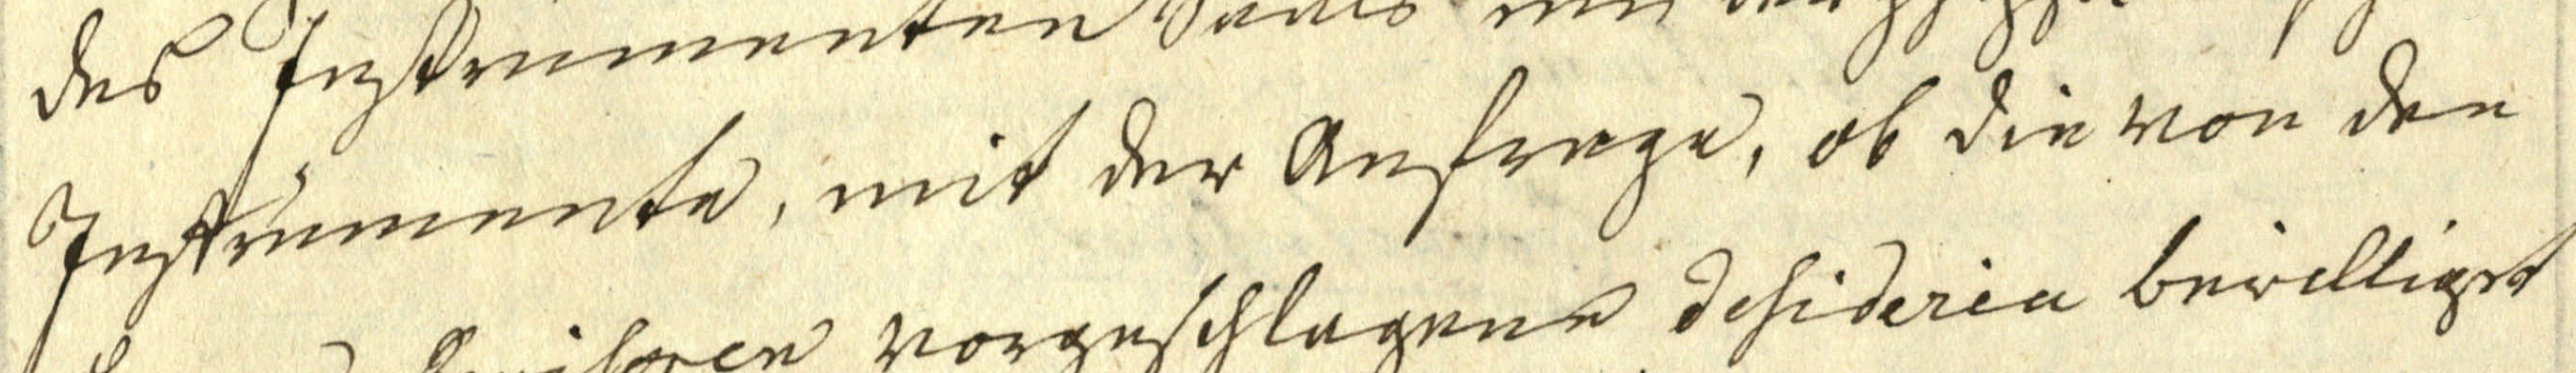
Instrumente, mit der Anfrage, ob die von den
